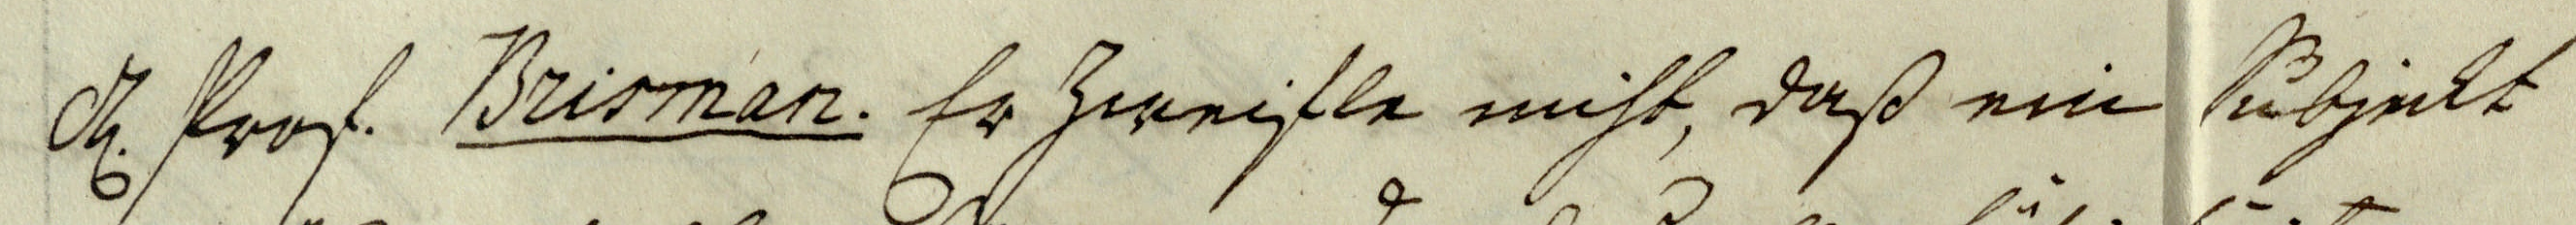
dh. Prof. Brismann. Er zweifle nicht, daß ein Subjeckt
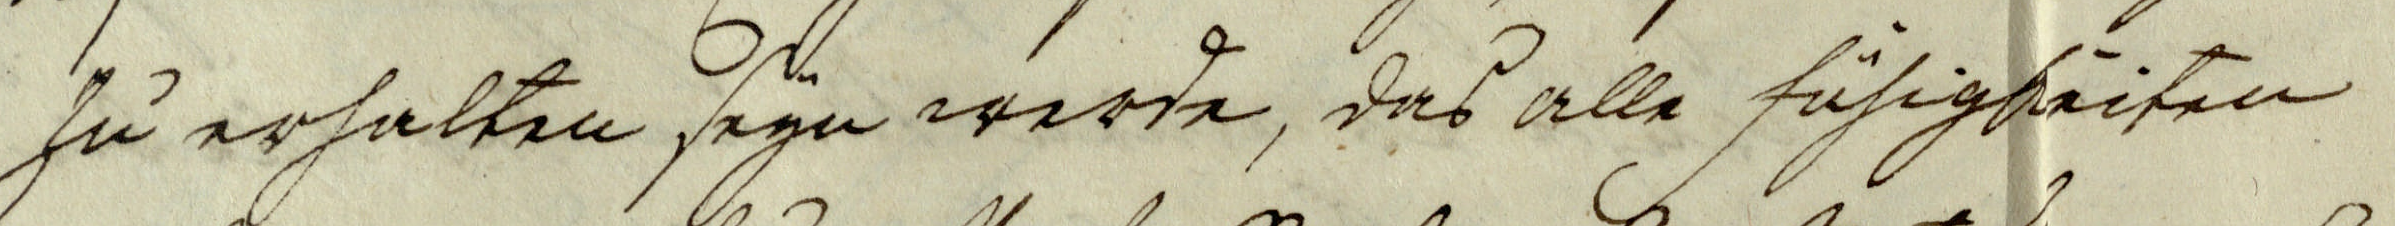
zu erhalten seÿn werde, das alle Fähigkeiten
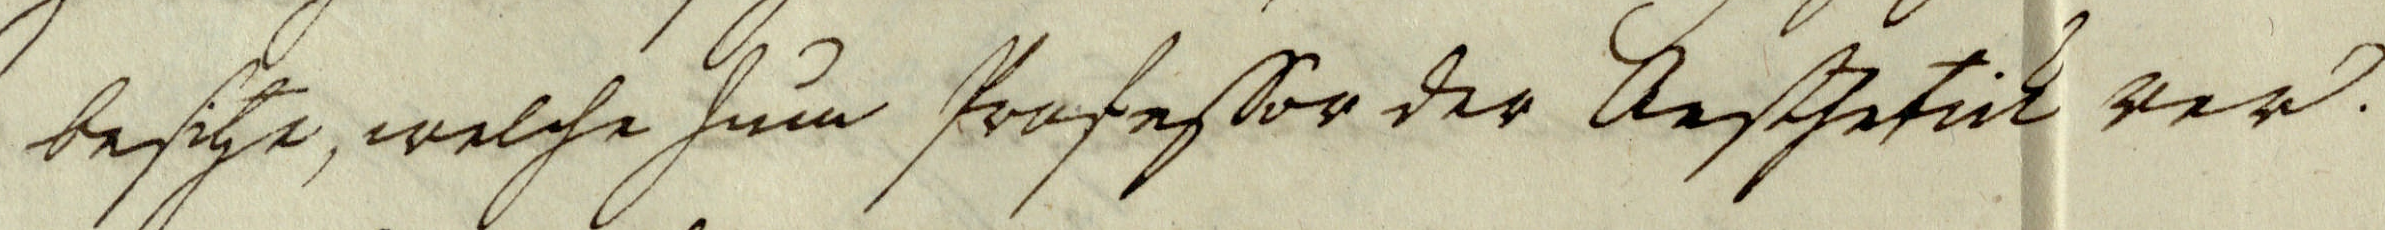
besitze, welche zum Professor der Aethetick ver¬
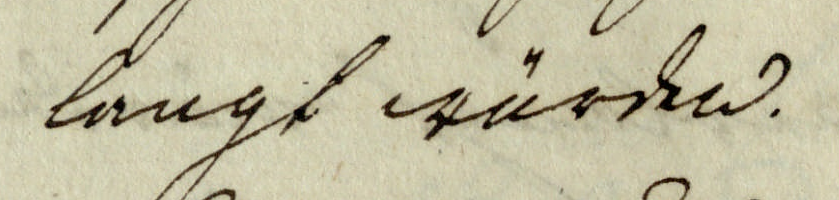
langt würden.
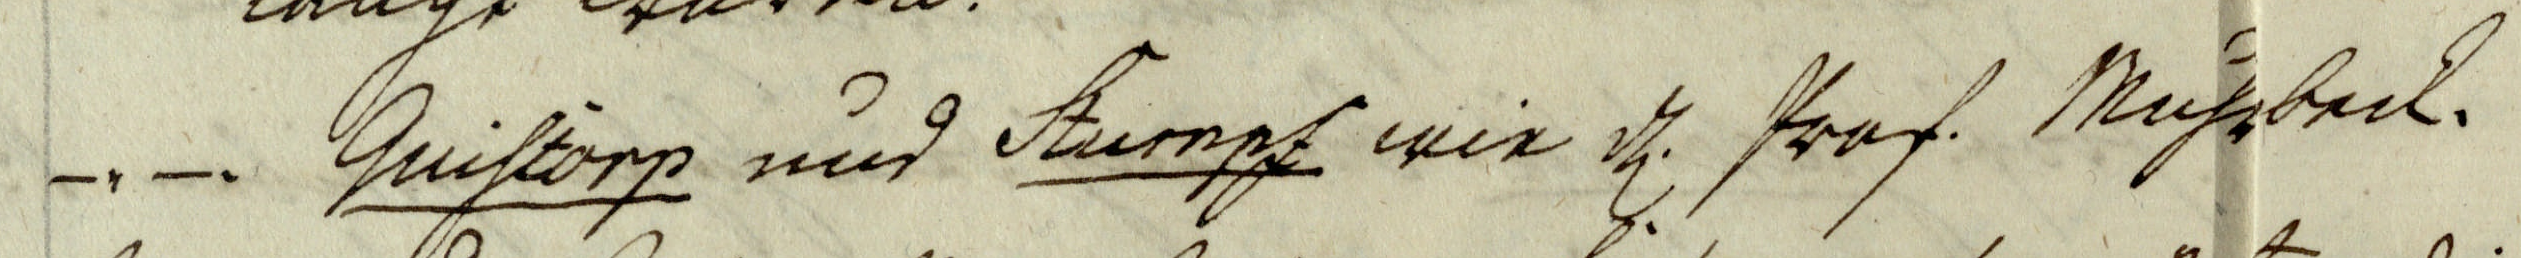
— " — . Quistorp und Stumpf. wie dh. Prof. Muhrbeck.
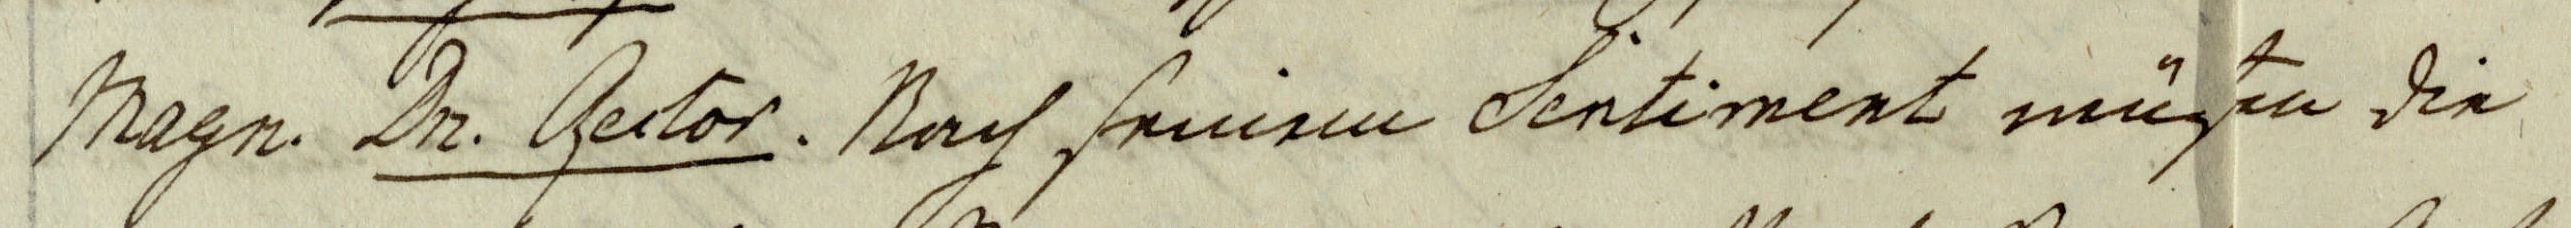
Magn. Dn. Rector. Nach seinem Sentiment müssten die
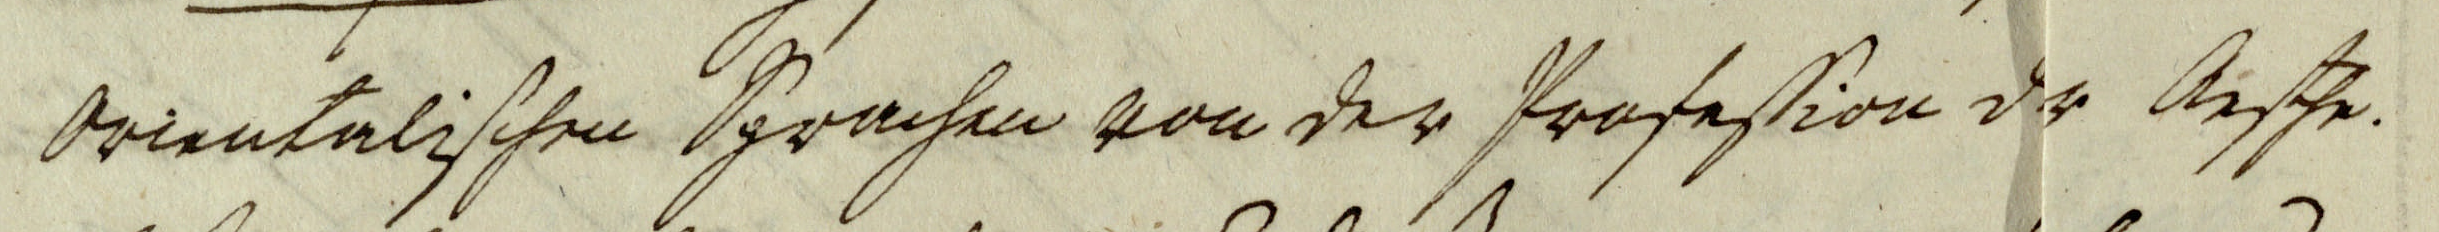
Orientalischen Sprachen von der Profession der Aesthe¬
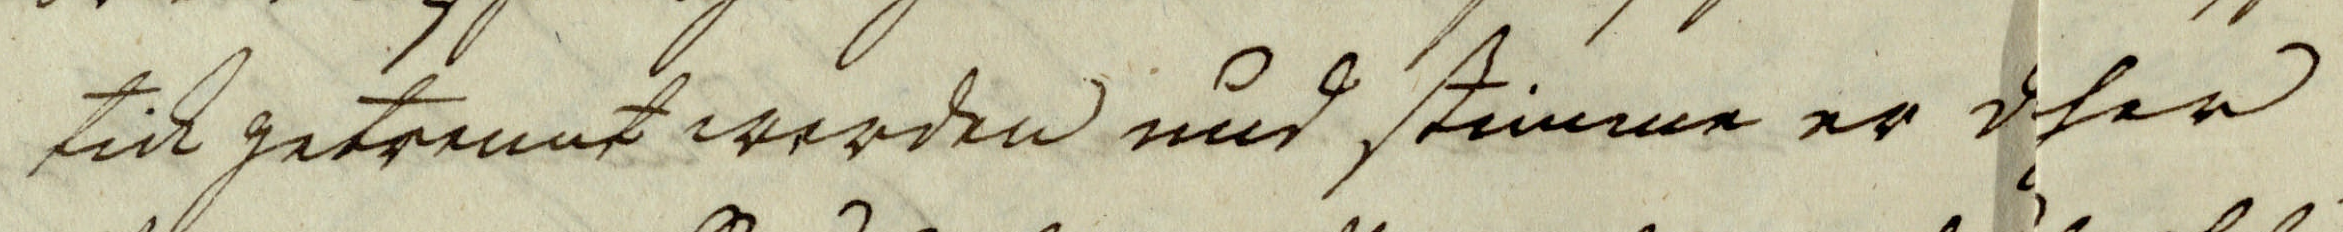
tick getrennt werden und stimme er daher
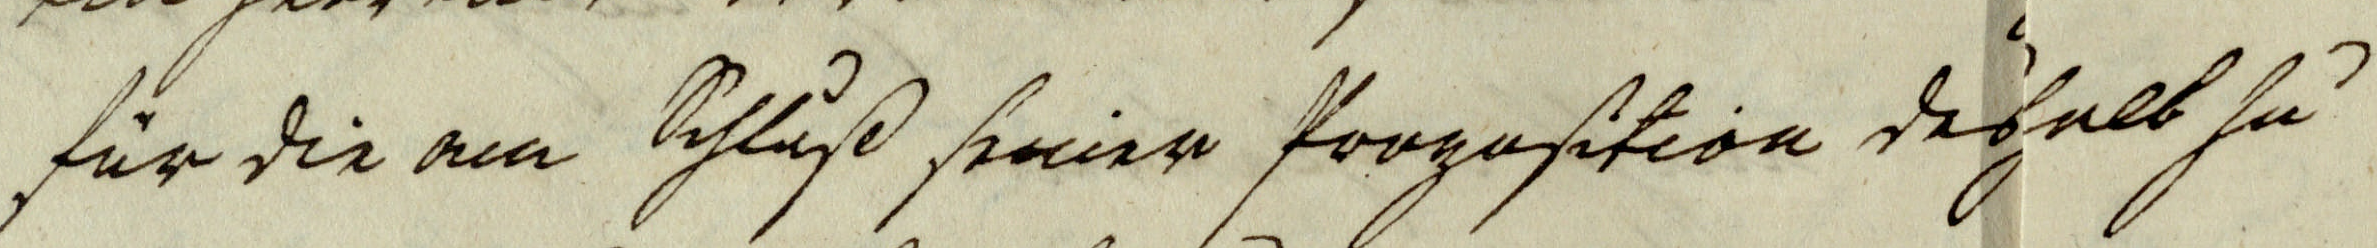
für die am Schluß seiner Proposition deshalb zu
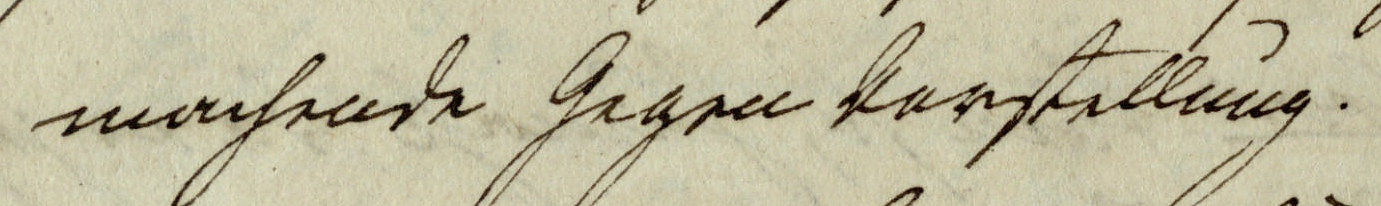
machende Gegen Vorstellung.
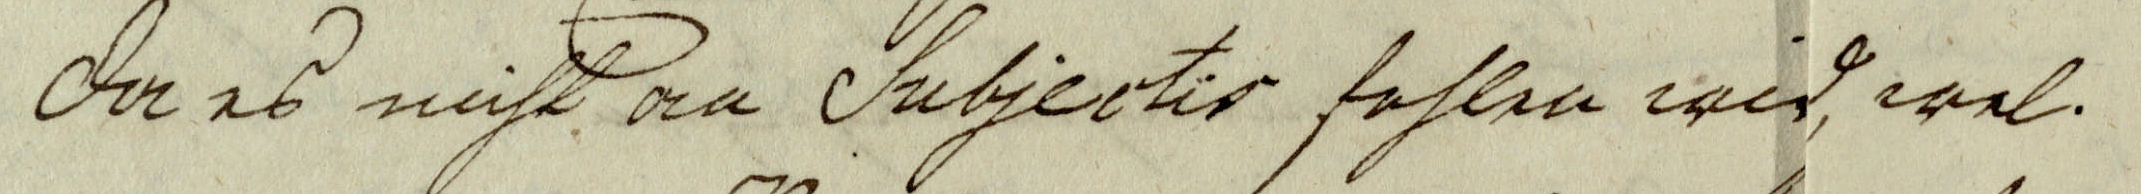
Da es nicht an Subjectis fehlen wird, wel¬
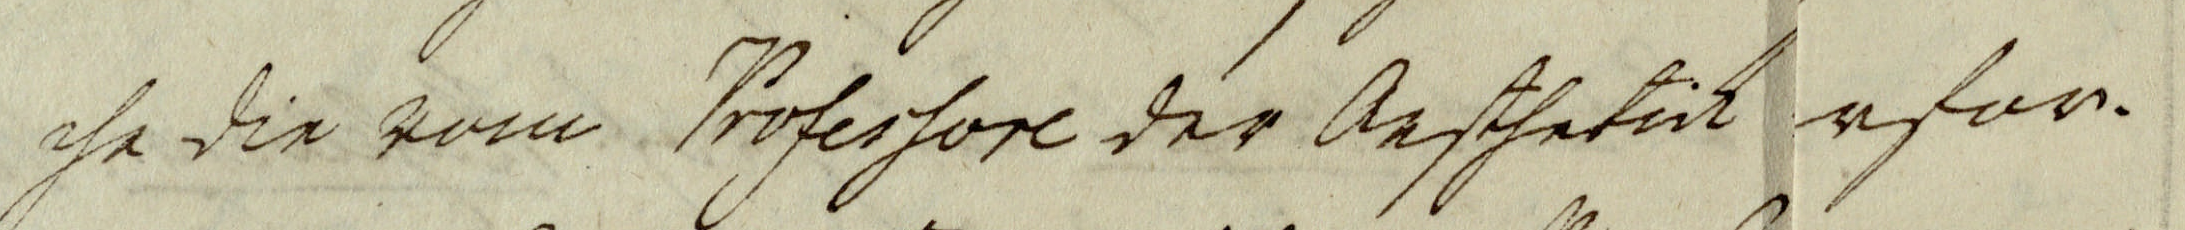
che die vom Professore der Aesthetick erfor¬
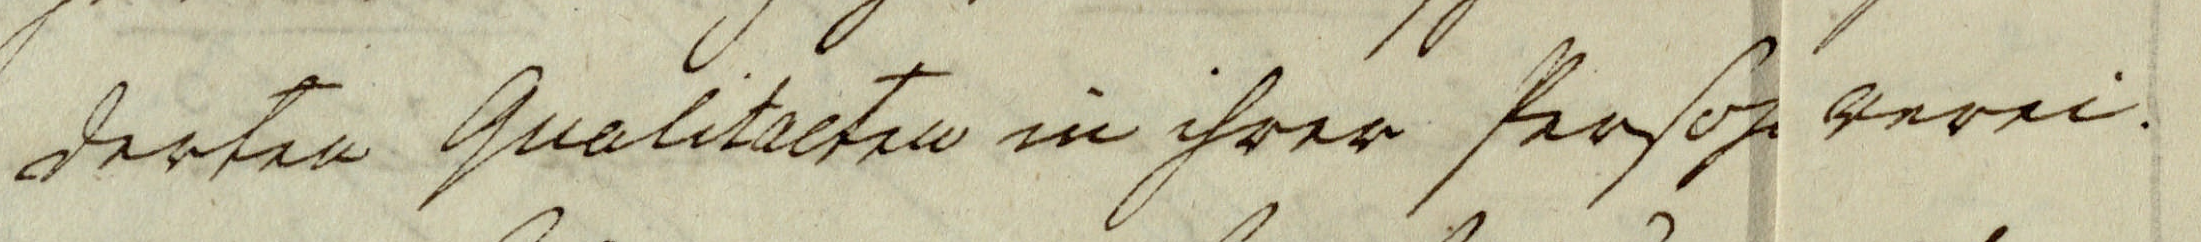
derten Qualitäten in ihrer Persohn verei¬
